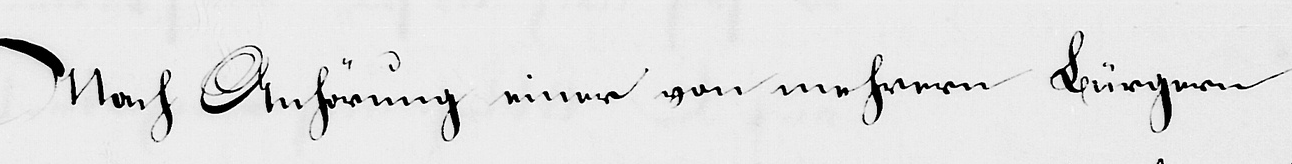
Nach Anhörung einer von mehrern Bürgern
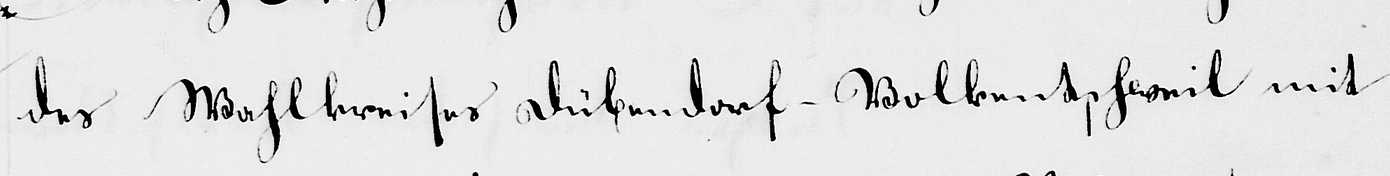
des Wahlkreises Dübendorf-Volkentschweil mit
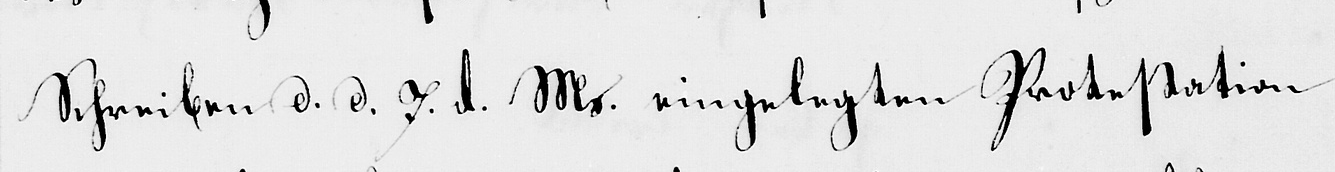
Schreiben d. d. 7. d. Ms. eingelegten Protestation
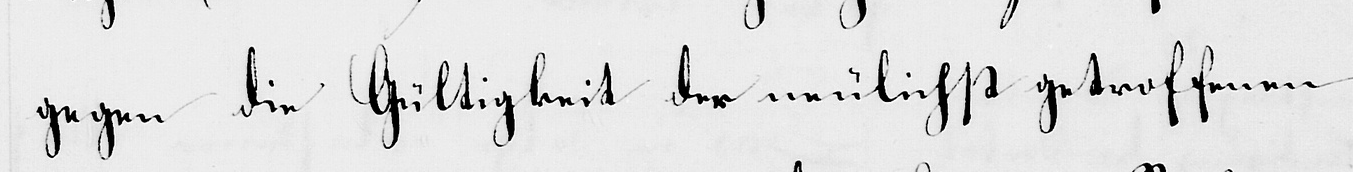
gegen die Gültigkeit der neulichst getroffenen
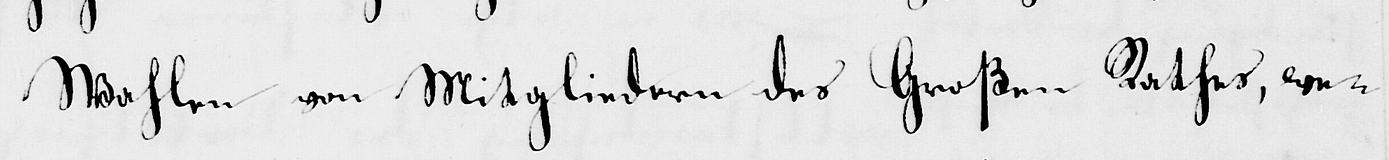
Wahlen von Mitgliedern des Großen Rathes, we¬
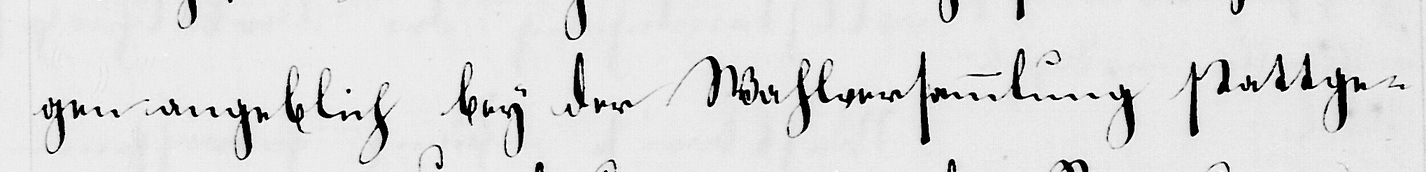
gen angeblich bey der Wahlversammlung stattge¬
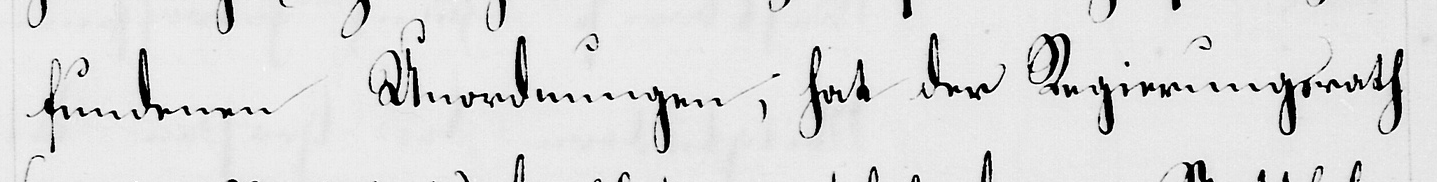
funden Unordnungen, hat der Regierungsrath
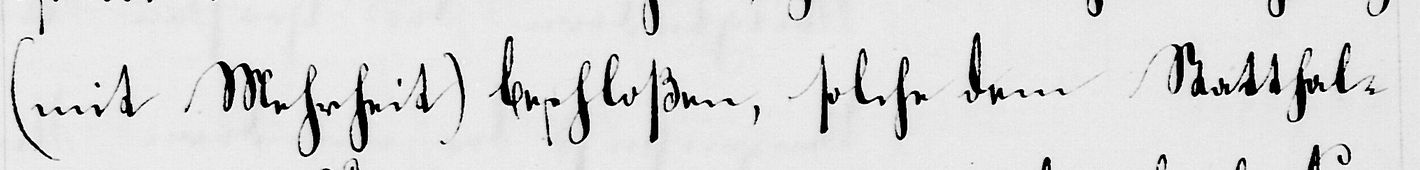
(mit Mehrheit) beschloßen, solche dem Statthal¬
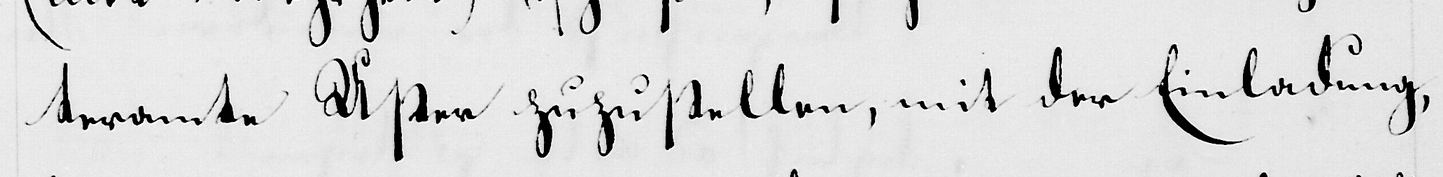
teramte Uster zuzustellen, mit der Einladung,
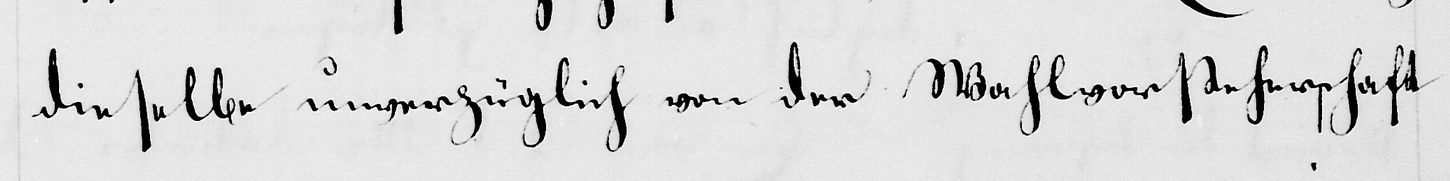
dieselbe unverzüglich von der Wahlvorsteherschaft
